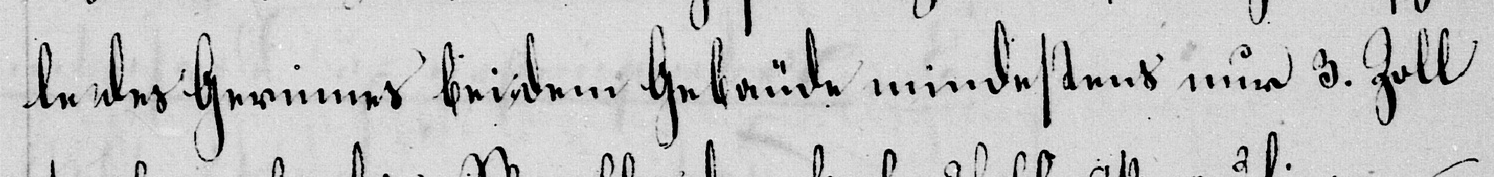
le des Gerinnes bei dem Gebäude mindestens nur 3. Zoll
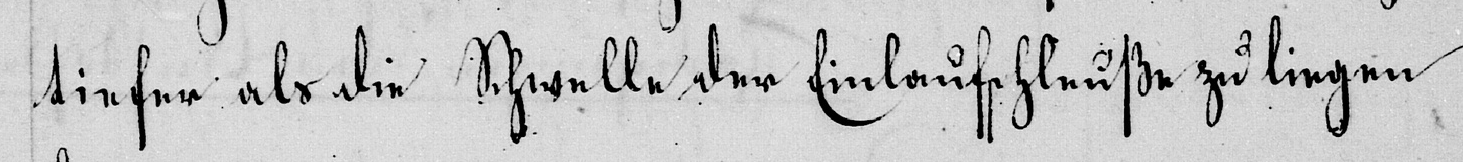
tiefer als die Schwelle der Einlaufschleuße zu liegen
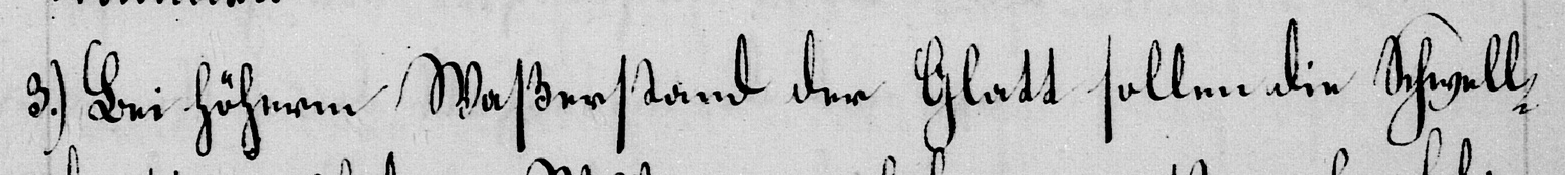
3.) Bei höherm Waßerstand der Glatt sollen die Schwell¬
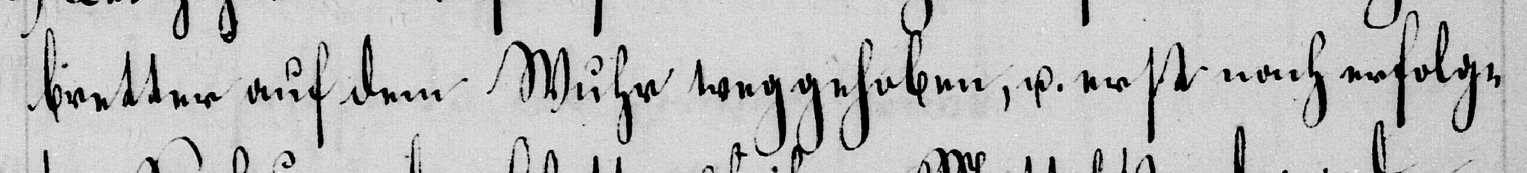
bretter auf dem Wuhr weggehoben, u. erst nach erfolg¬
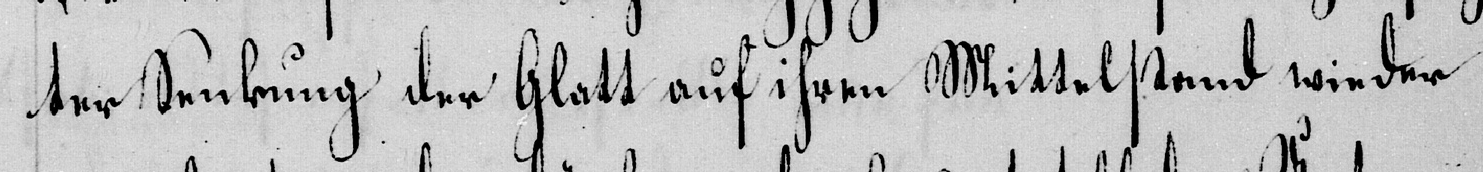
ter Senkung der Glatt auf ihren Mittelstand wieder
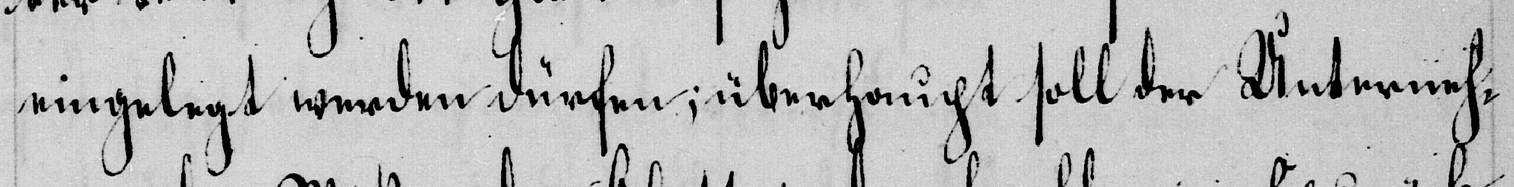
eingelegt werden dürfen; überhaupt soll der Unterneh¬
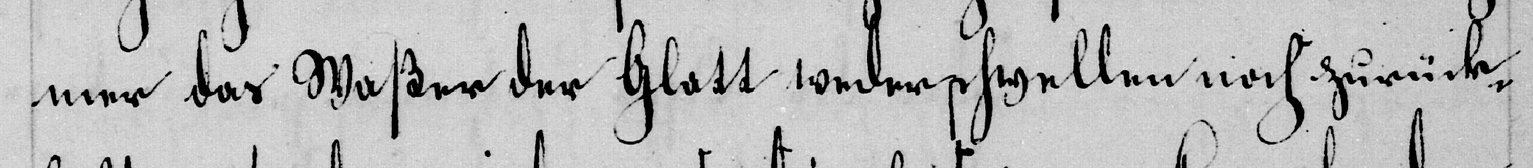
mer das Waßer der Glatt weder schwellen noch zurück¬
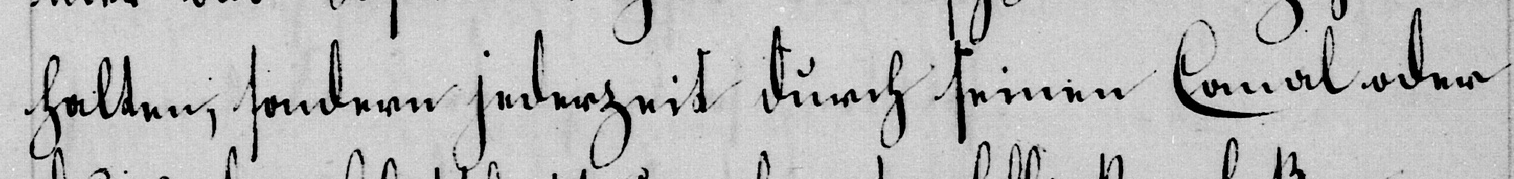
halten, sondern jederzeit durch seinen Canal oder
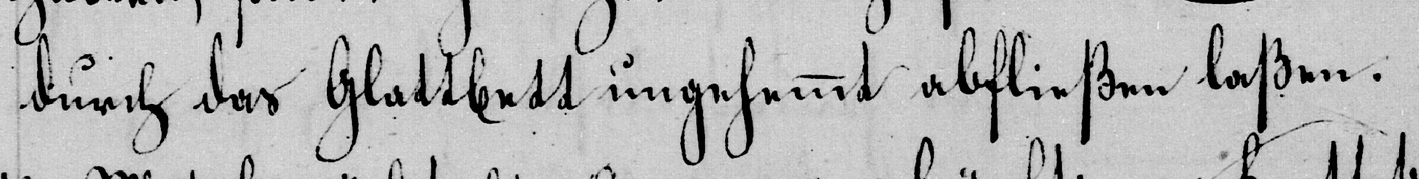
durch das Glattbett ungehemmt abfließen laßen.
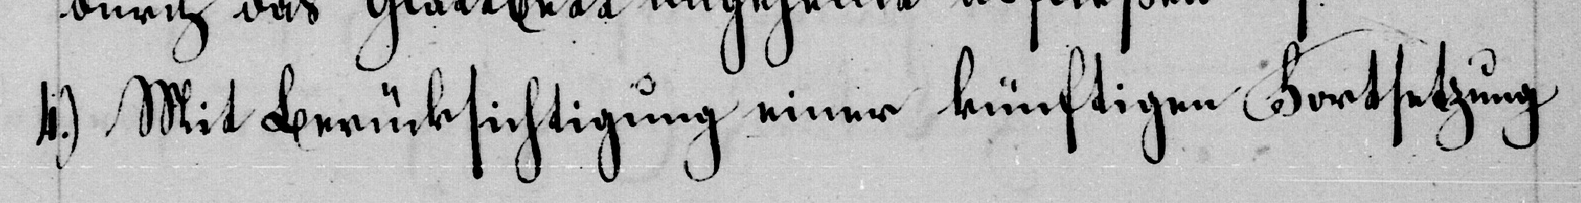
4.) Mit Berücksichtigung einer künftigen Fortsetzung
